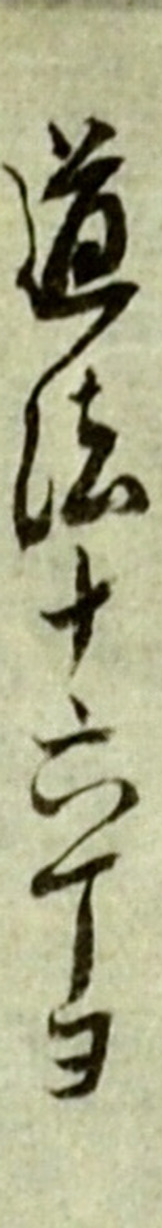道法十六丁ヲ
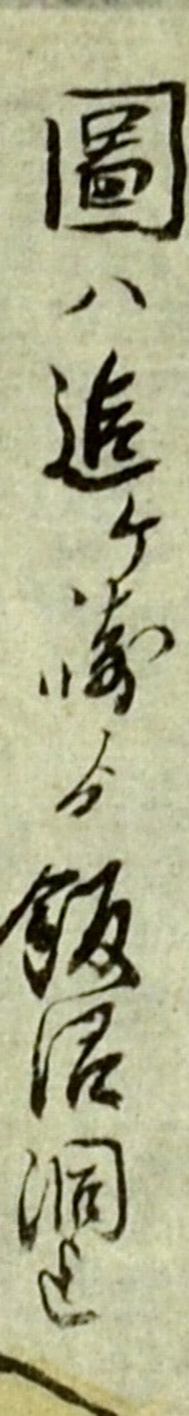図ハ追ケ崎ゟ飯沼洞迄
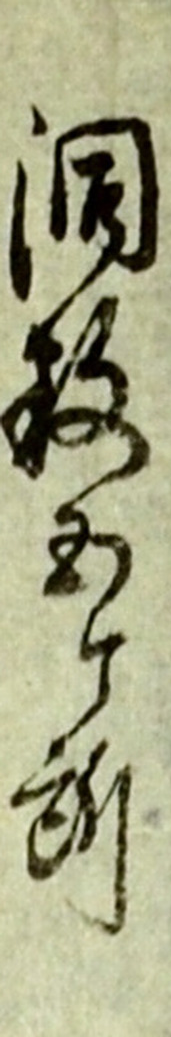洞数五ケ所
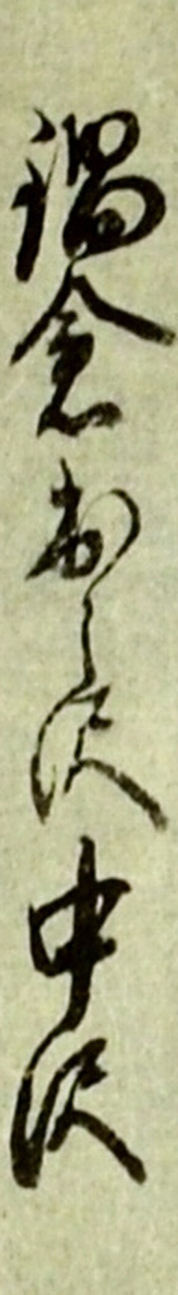鍋倉出之沢中沢
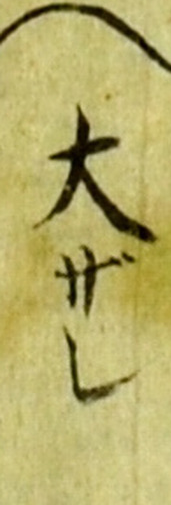大サレ
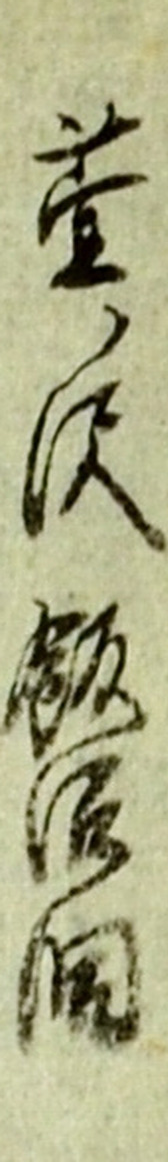萱ノ沢飯沼洞
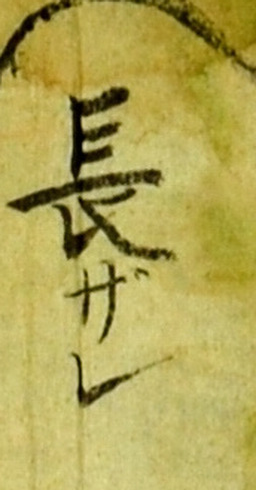長サレ
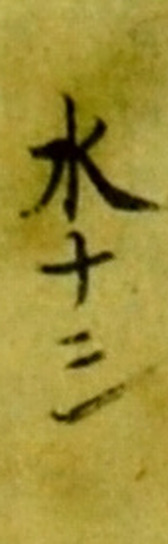水ナシ
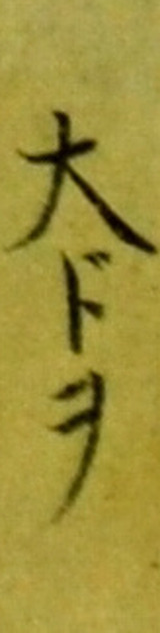大ドヲ
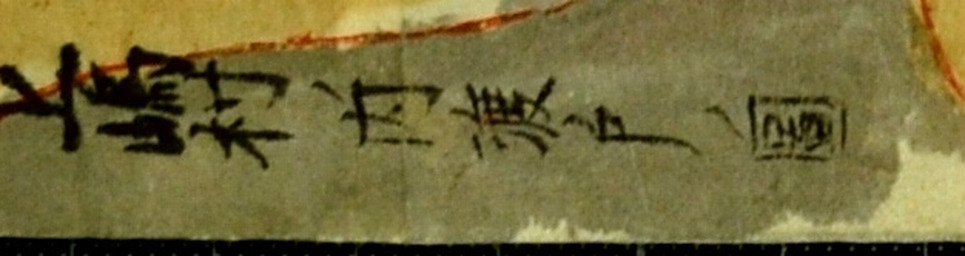上嶋村ノ内渡戸ノ図
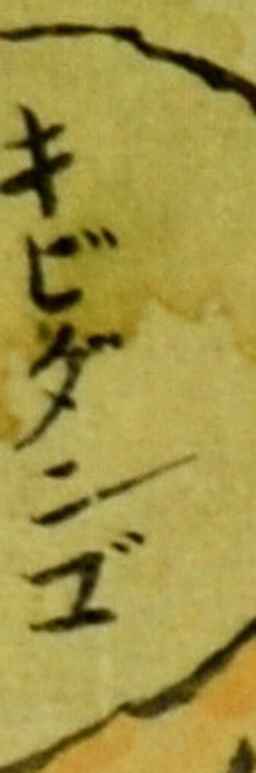キビダンゴ
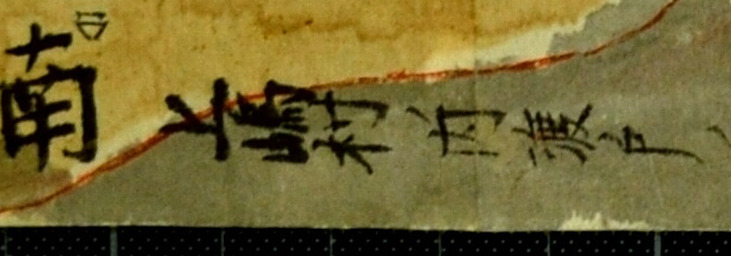上嶋村ノ内渡戸ノ図
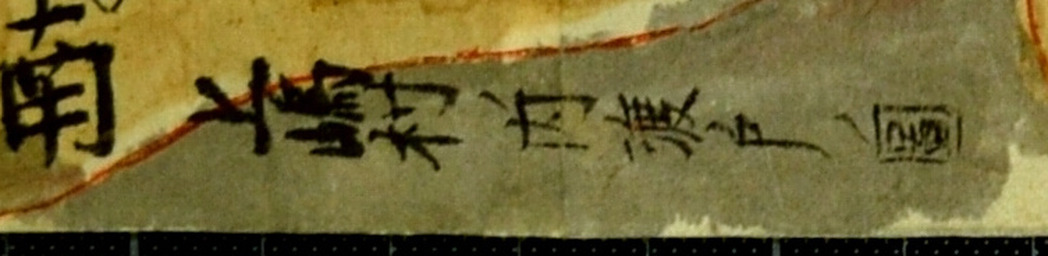上嶋村ノ内渡戸ノ図

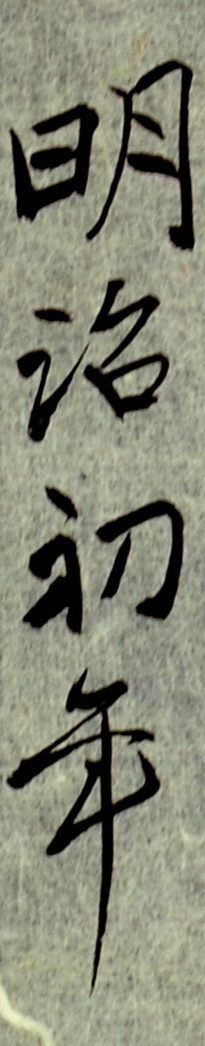明治初年
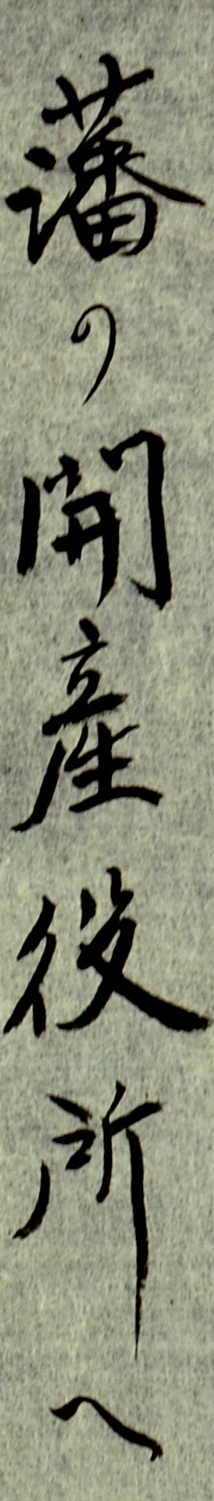藩の開産役所へ
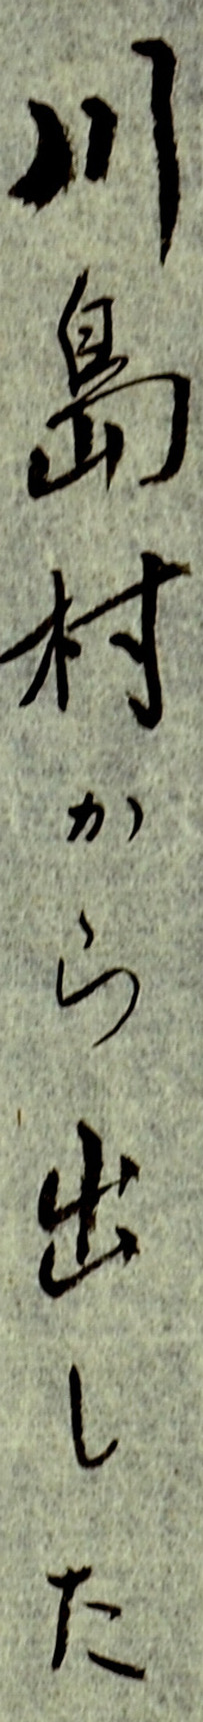川島村から出した
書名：乍恐以書付奉願上候御事
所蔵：伊那市立高遠町図書館・合同会社AMANE
